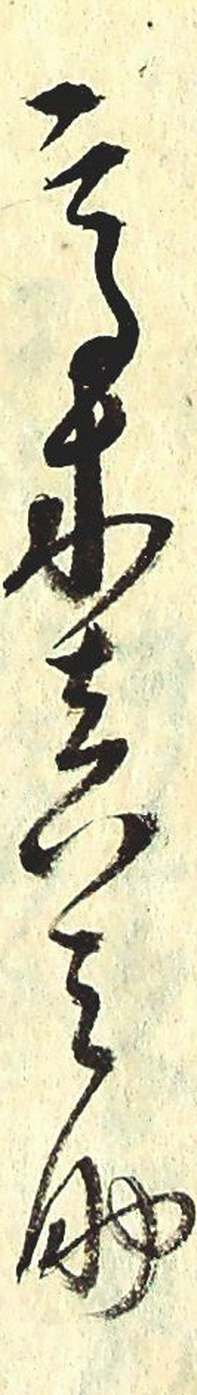高木真之助
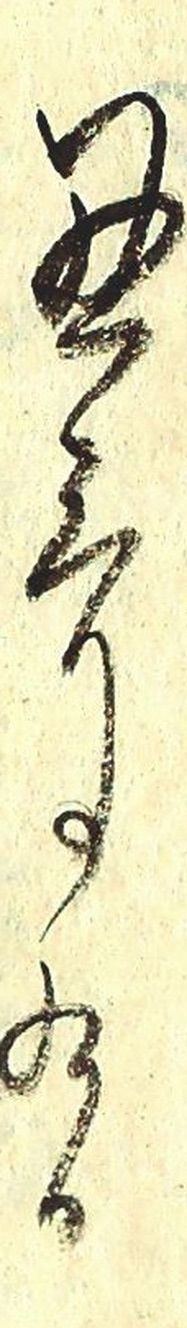丑三月九日
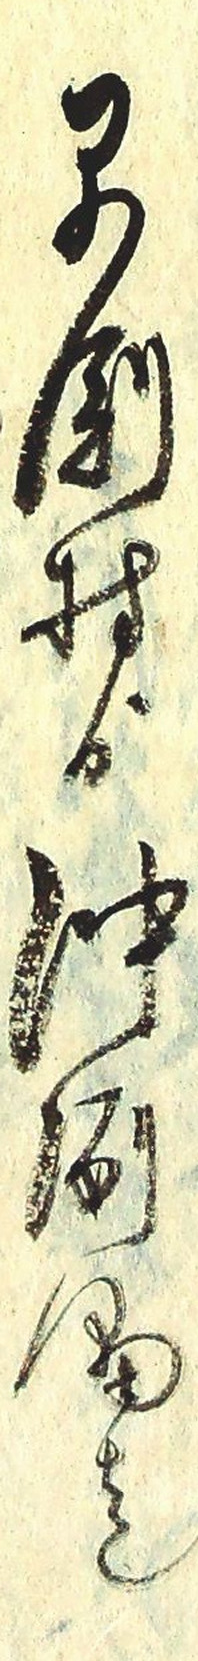早渕村ゟ沖洲浦迄
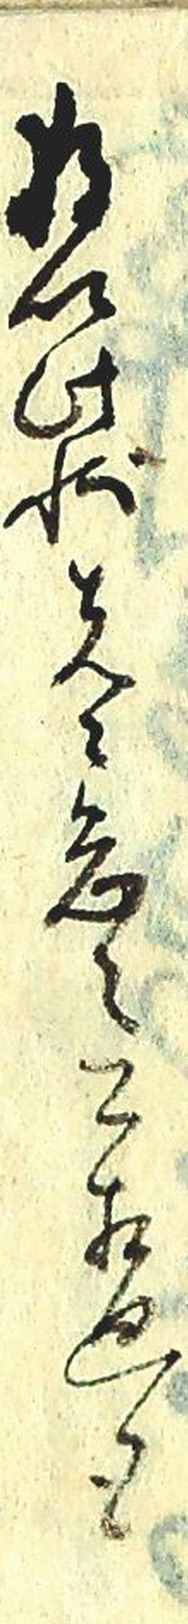猶以此状先々急々可相廻候以上
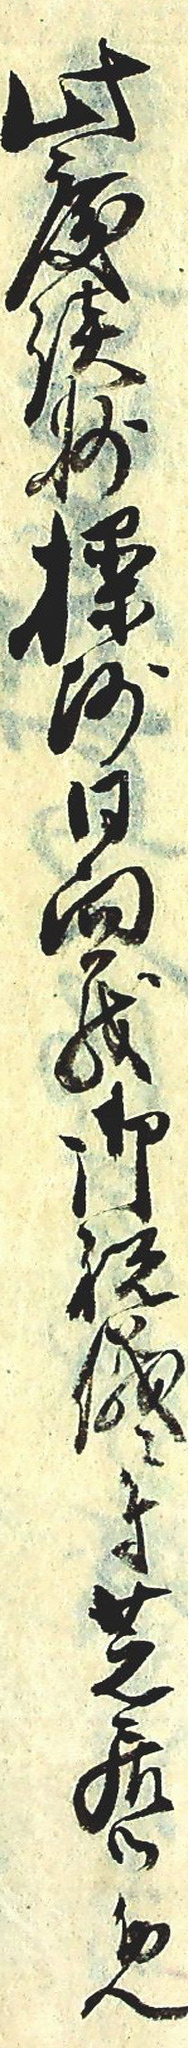此度淡州操師日向義御祝儀に付芝居御免
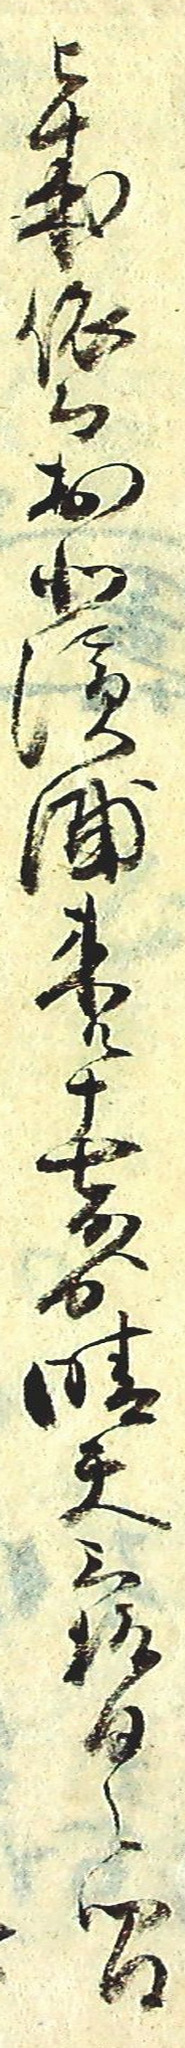被成依て於北浜浦来る十七日ゟ晴天三拾日之間
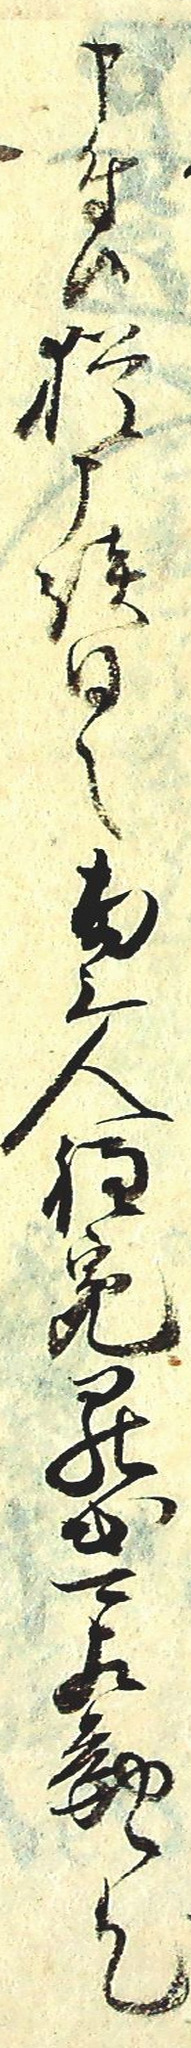申付候猶申談日々両三人程宛罷出可相勤候尤
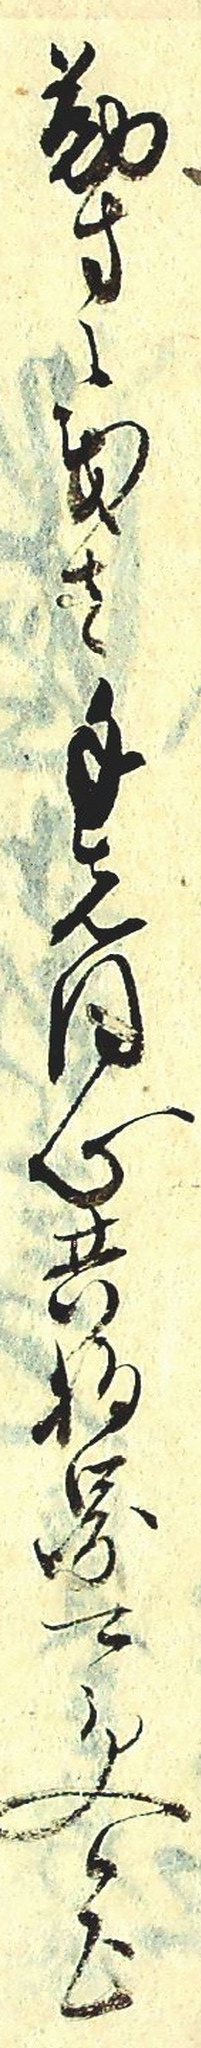勤方之義は手先同心共指図可受候以上
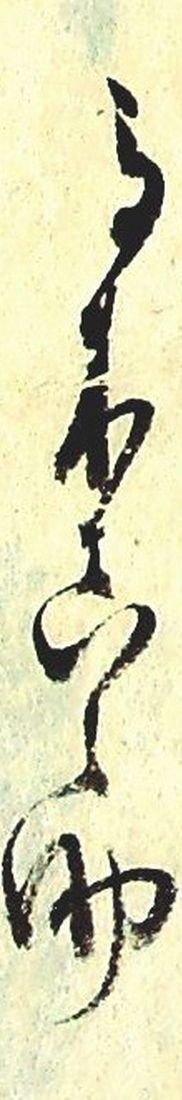高木真之助
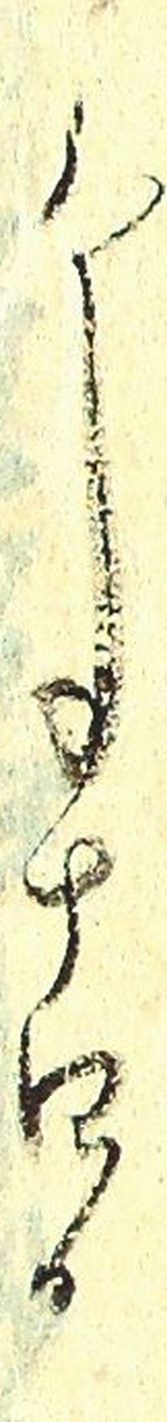三月十四日
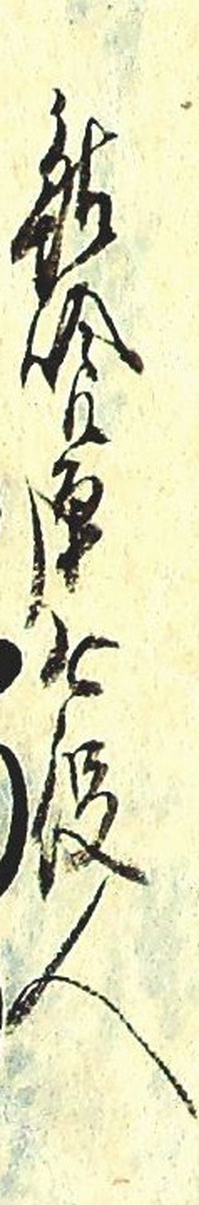鮎喰原無役人
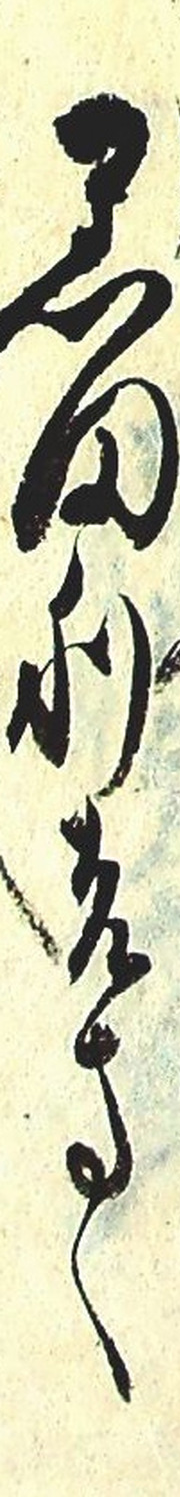黒田利吉方へ
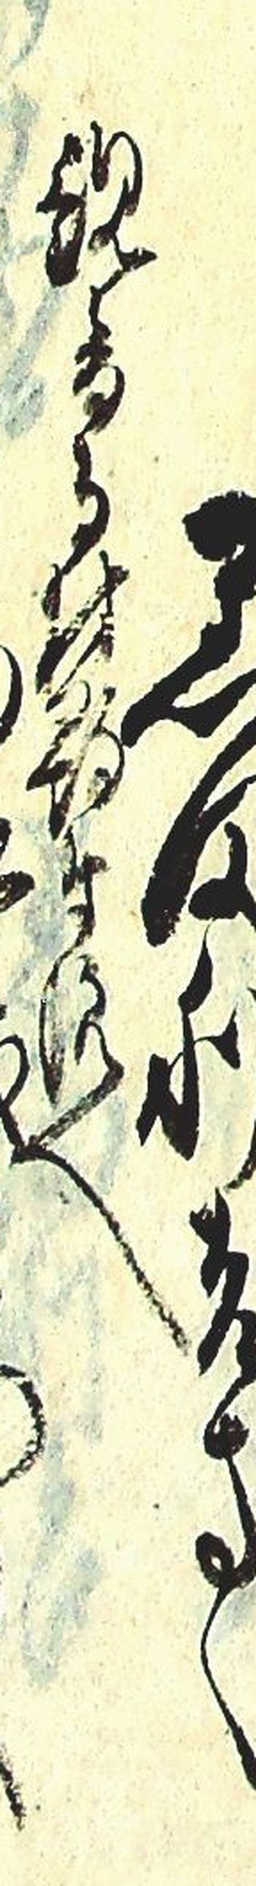観音寺村郡付浪人
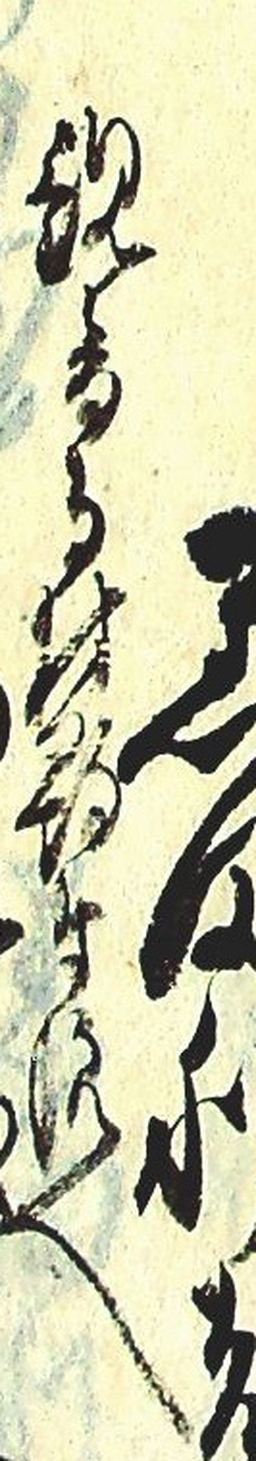観音寺村郡付浪人
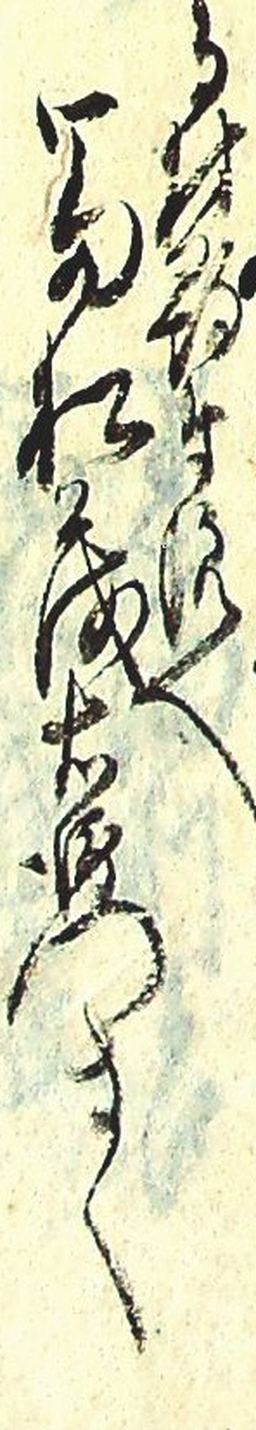冨松茂右衛門方へ

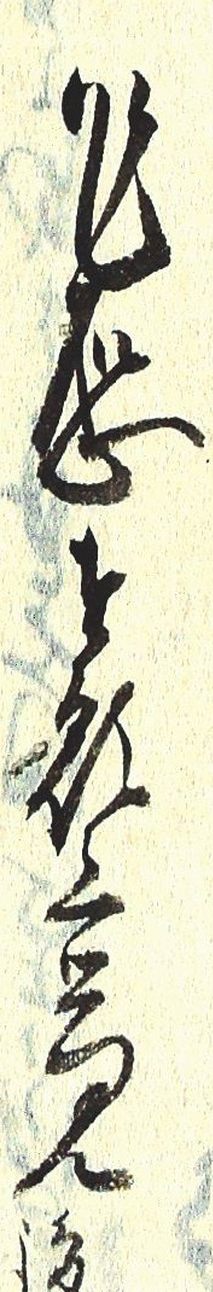乍恐奉願上覚
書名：諸御願書控(弐番）
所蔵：鳴門教育大学 Naruto University of Education
